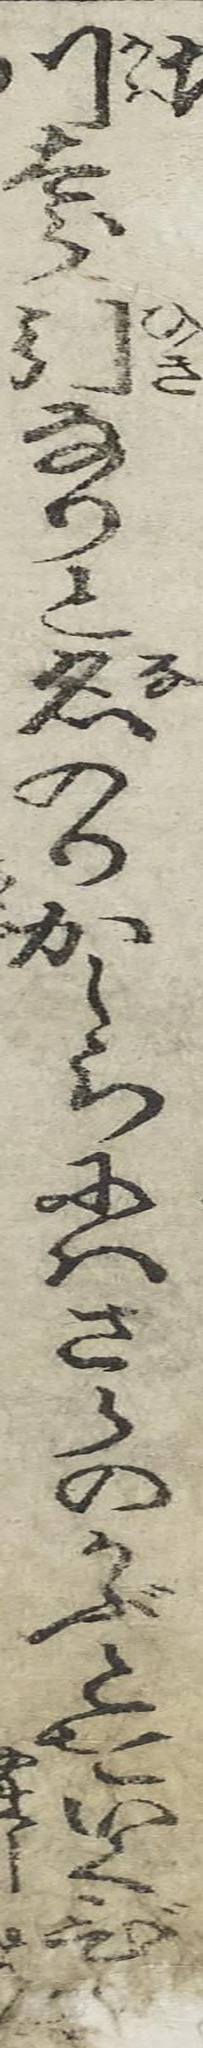川太郎引なりと名のりかしらにはさらのかぶとをいくび
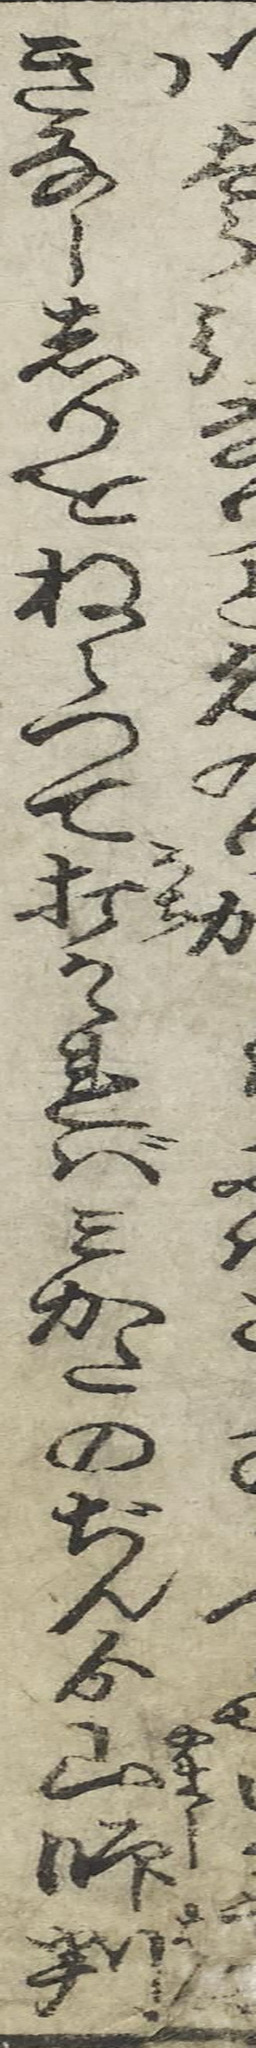きなししりをねらつて打かゝればみかたのぢんゟ山師判
